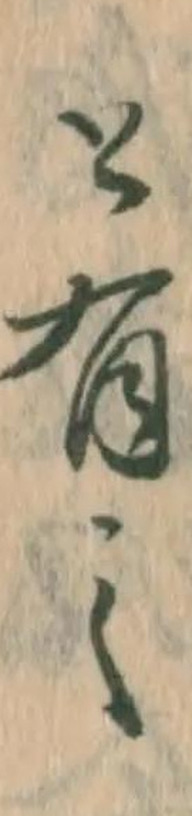と有之
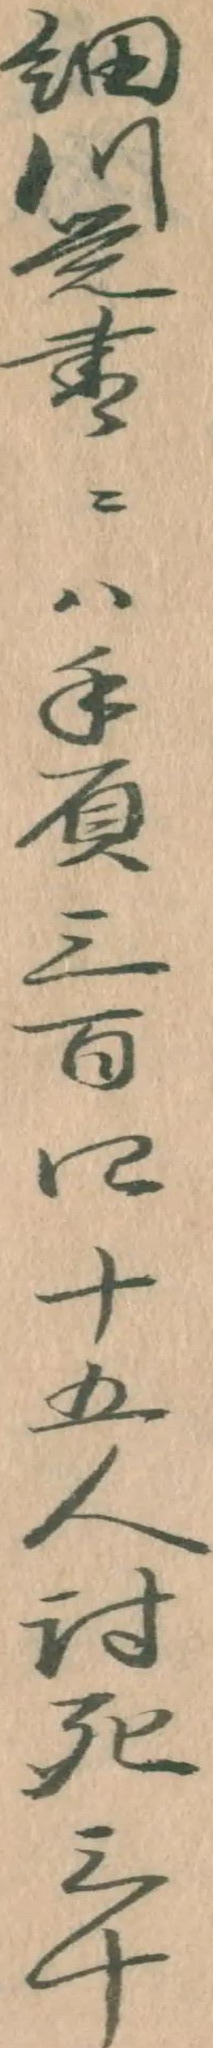細川覚書には手負三百四十五人討死三十
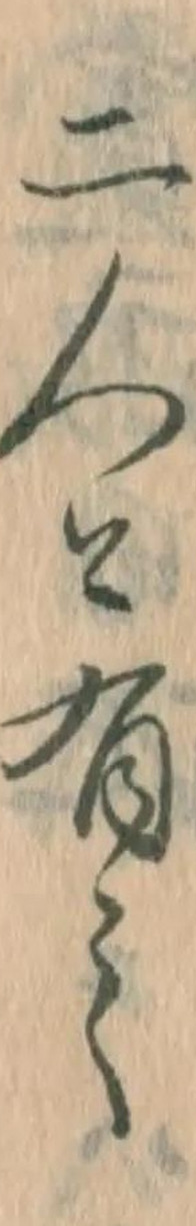二人と有之
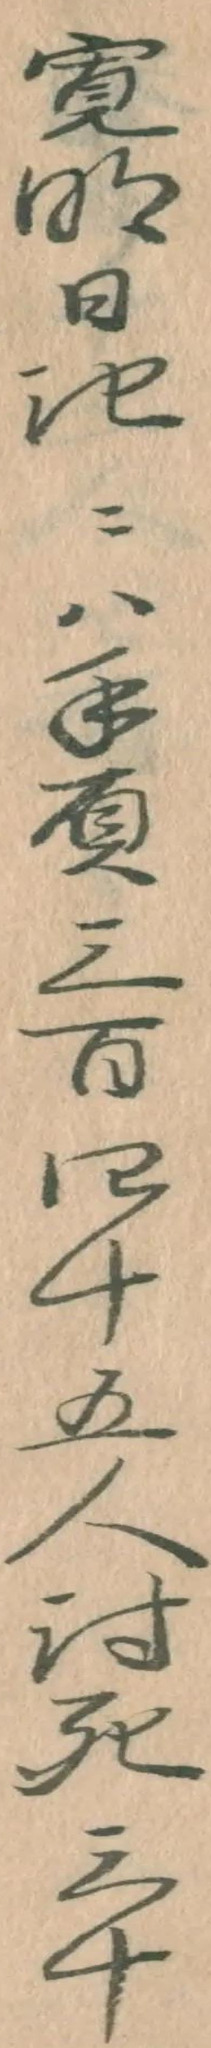寛明日記には手負三百四十五人討死三十
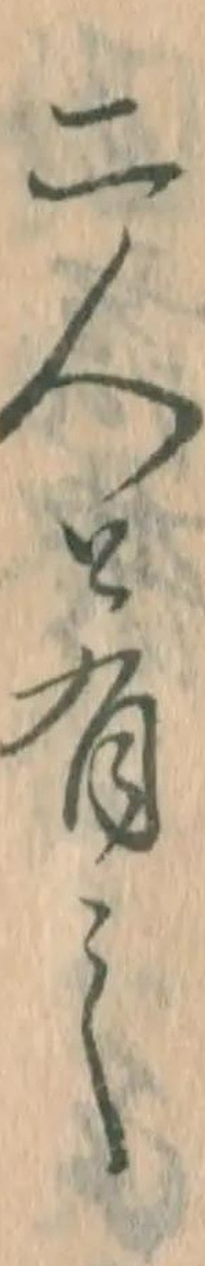二人と有之
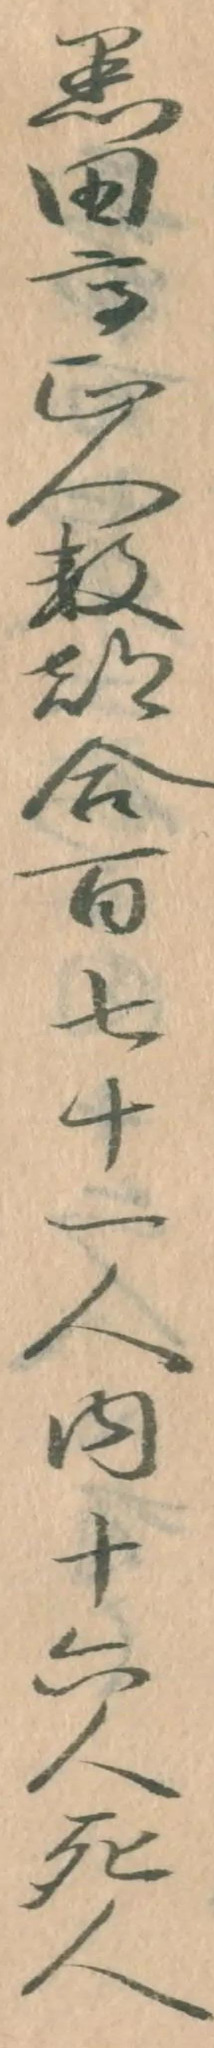黒田高正人数都合百七十一人内十六人死人

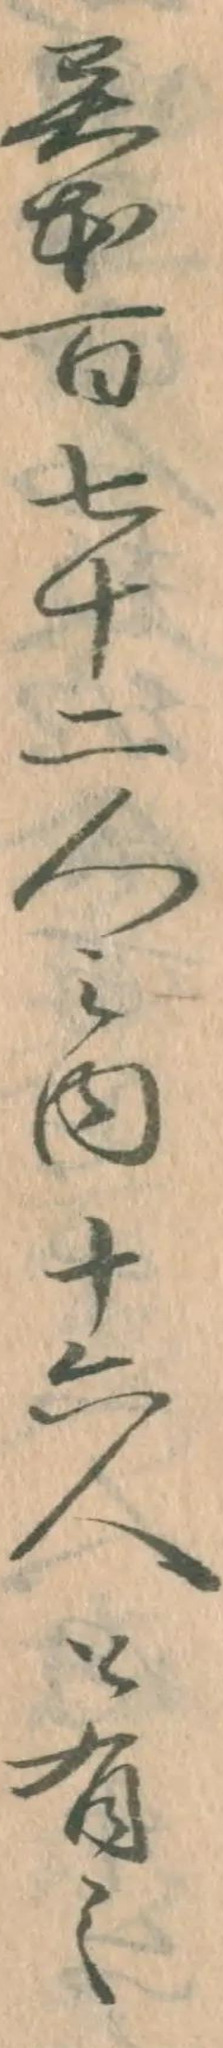異本百七十二人之内十六人と有之
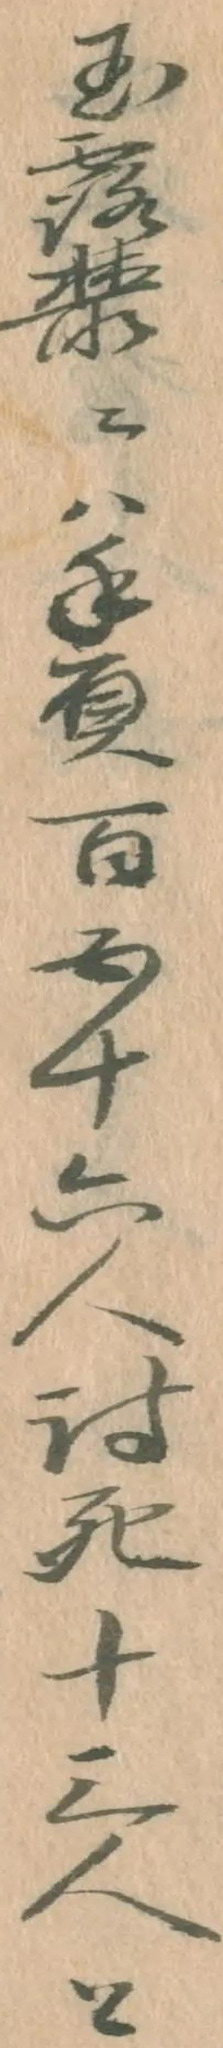玉露樷には手負百五十六人討死十三人と
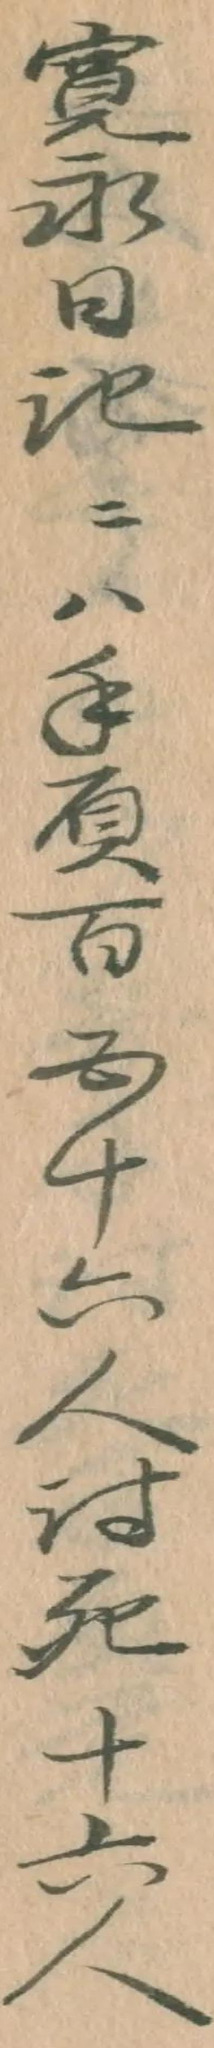寛永日記には手負百五十六人討死十六人
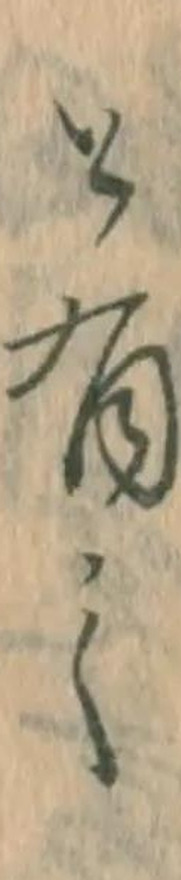と有之
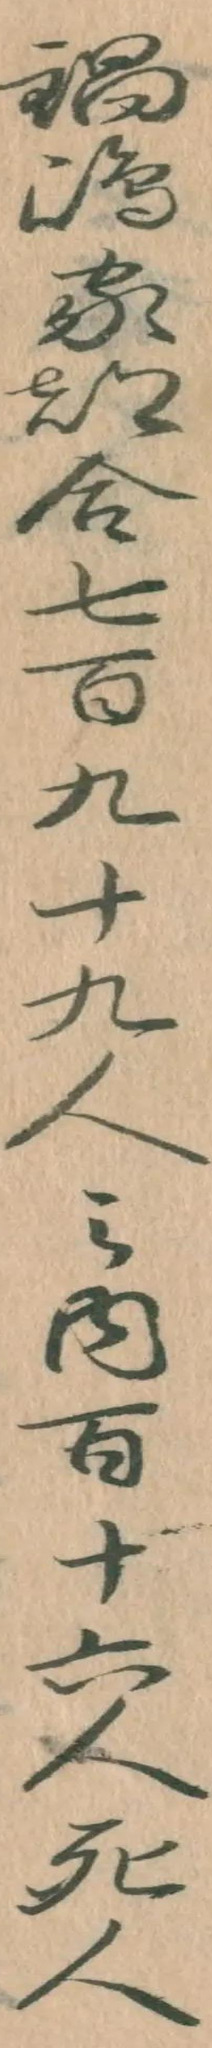鍋島家都合七百九十九人之内百十六人死人
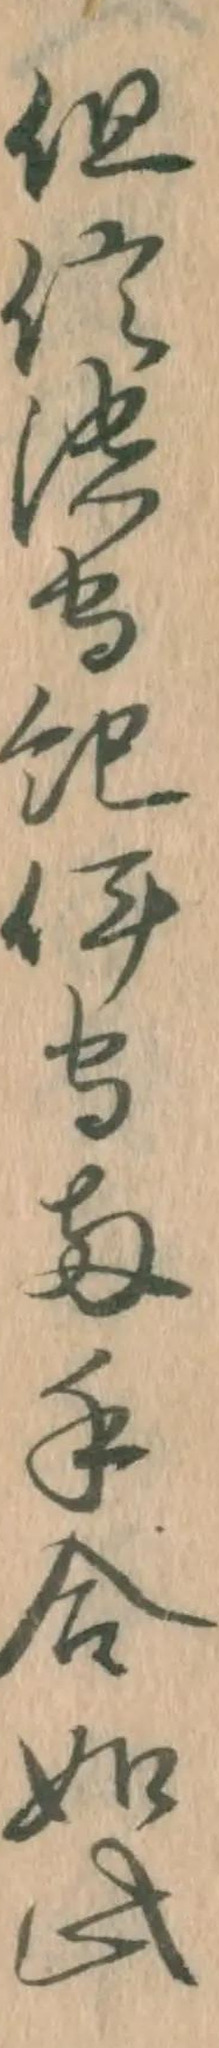但信濃守紀伊守両手合如此
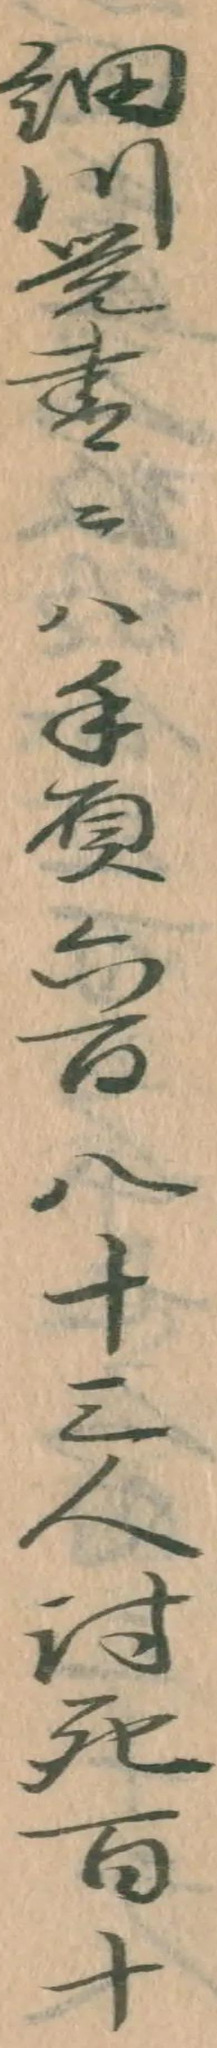細川覚書には手負六百八十三人討死百十
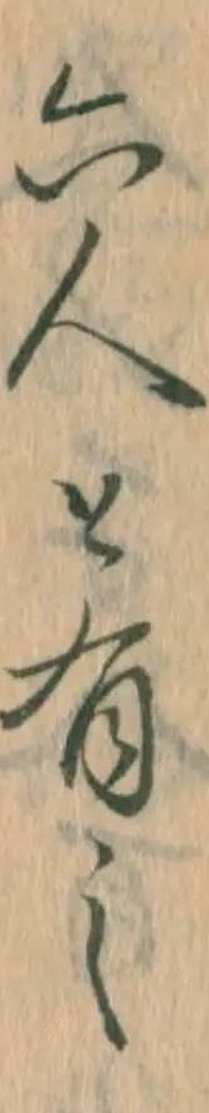六人と有之
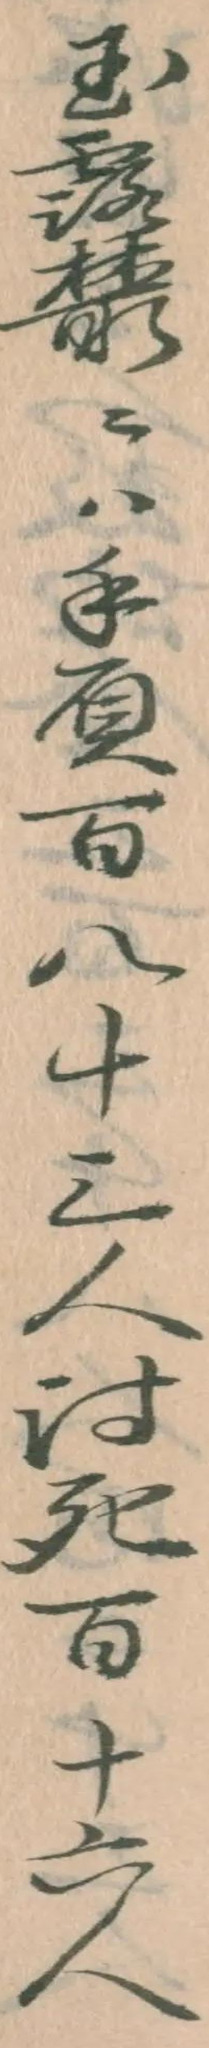玉露樷には手負百八十三人討死百十六人
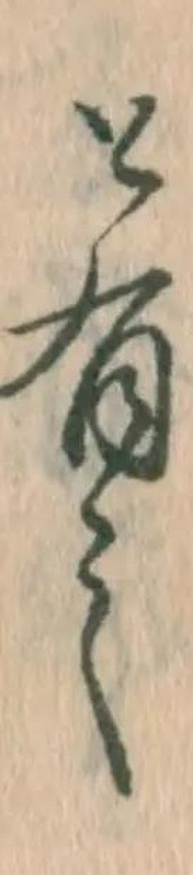と有之
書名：切支丹御退治記 49巻. [9]
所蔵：国立国会図書館 National Diet Library, JAPAN
